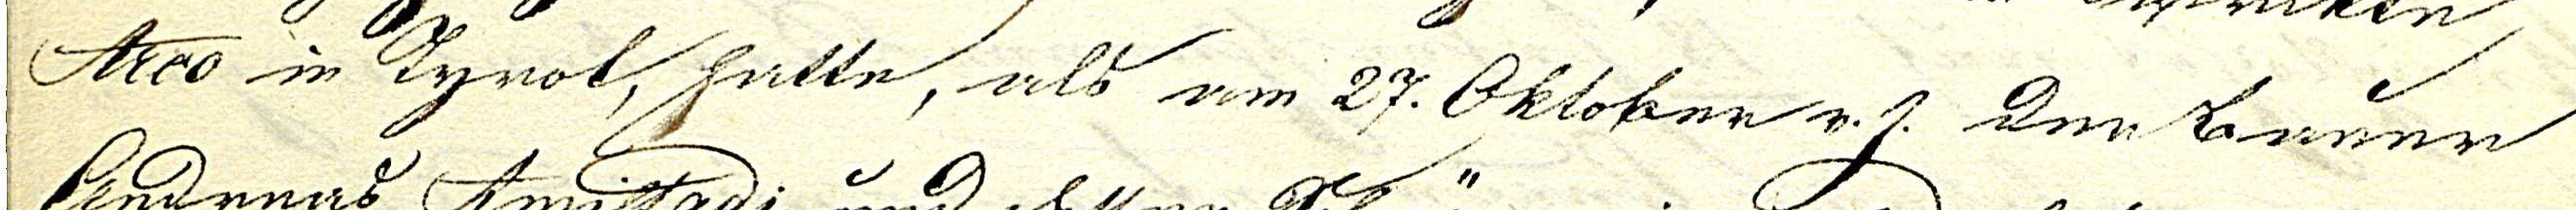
Arco in Tyrol, hatte, als am 27. Oktober v. J. der Bauer
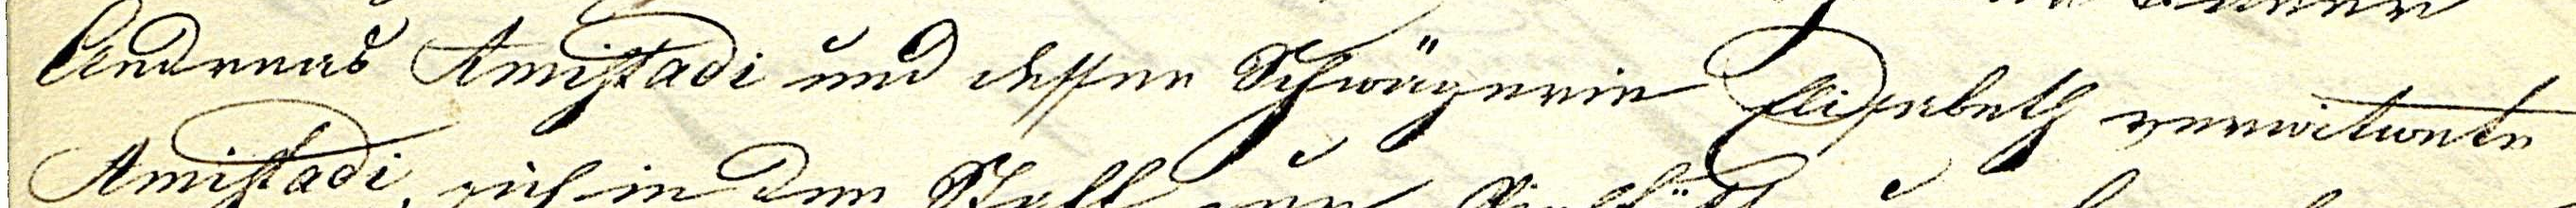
Andreas Amihtadi und dessen Schwägerin Elisabeth verwitwete
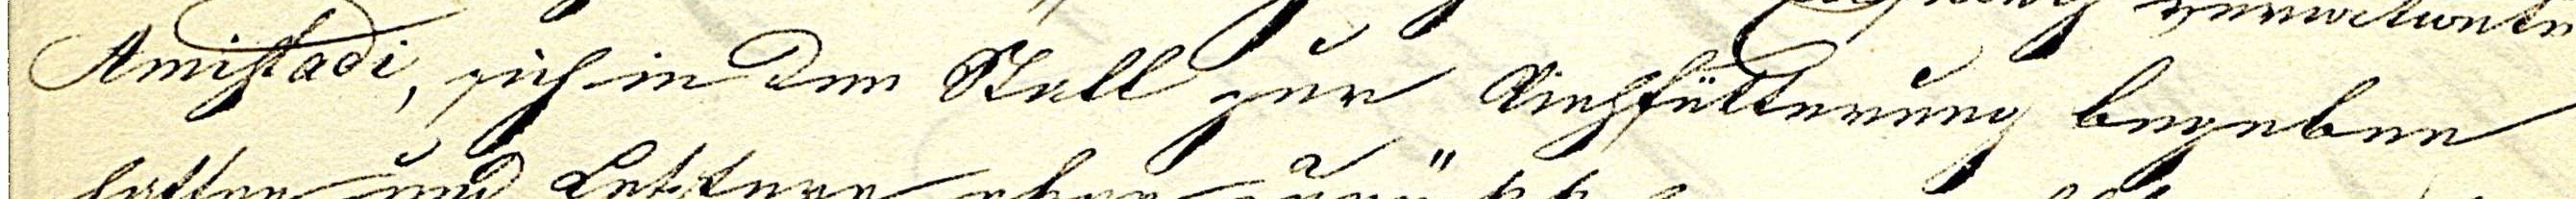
Amihtadi, sich in dem Stall zur Viehfütterung begeben
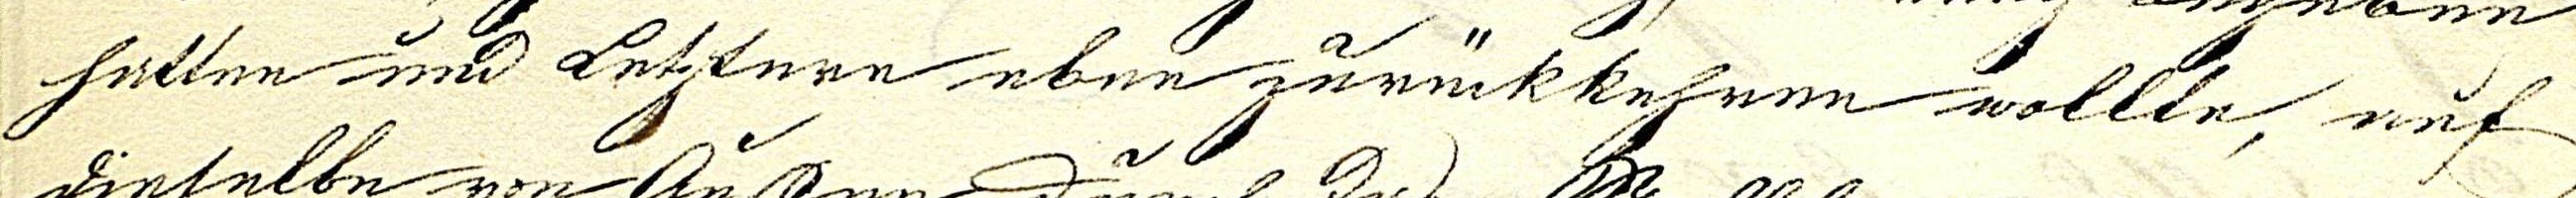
hatten und Letztere eben zurückkehren wollte, auf
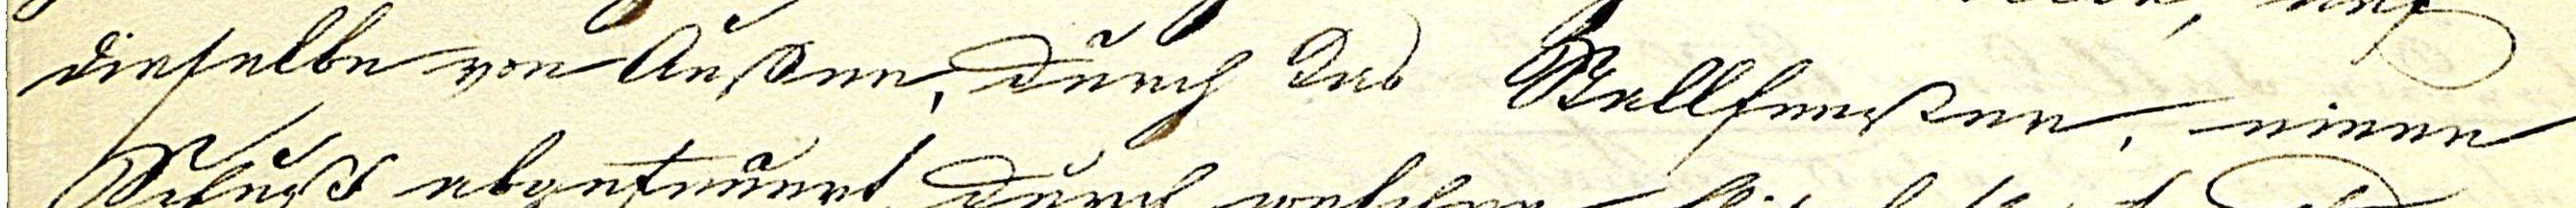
dieselbe von Außen, durch das Stallfenster, einen
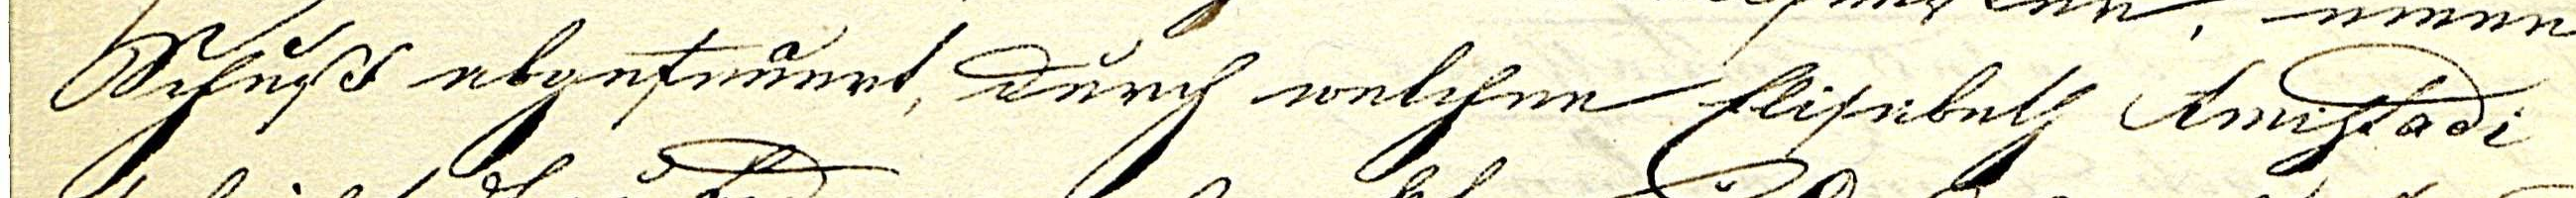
Schuß abgefeuert, durch welchen Elisabeth Amihtadi
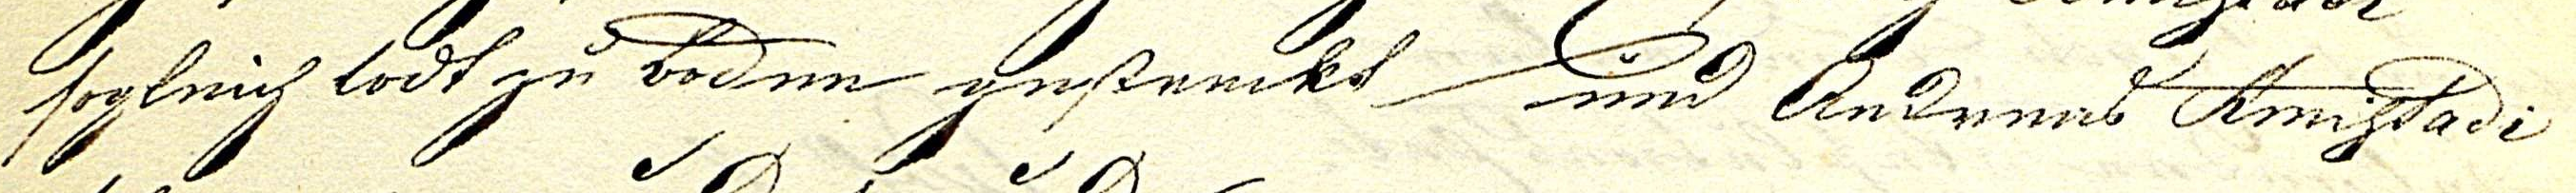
sogleich todt zu Boden gestreckt und Andreas Amihtadi
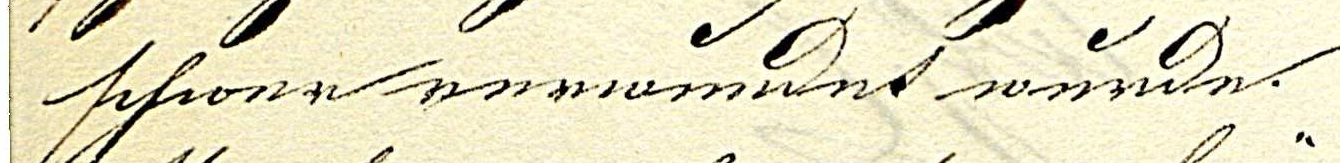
schwer verwundet wurde.
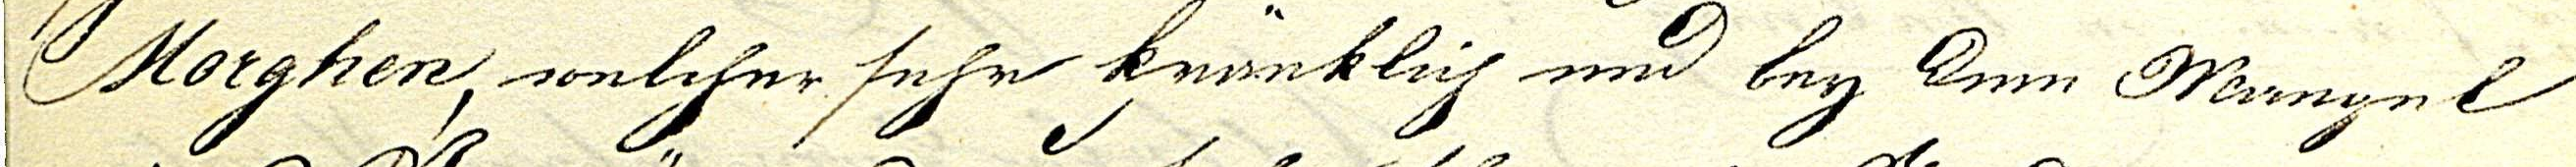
Morghen, welcher sehr kränklich und bey dem Mangel
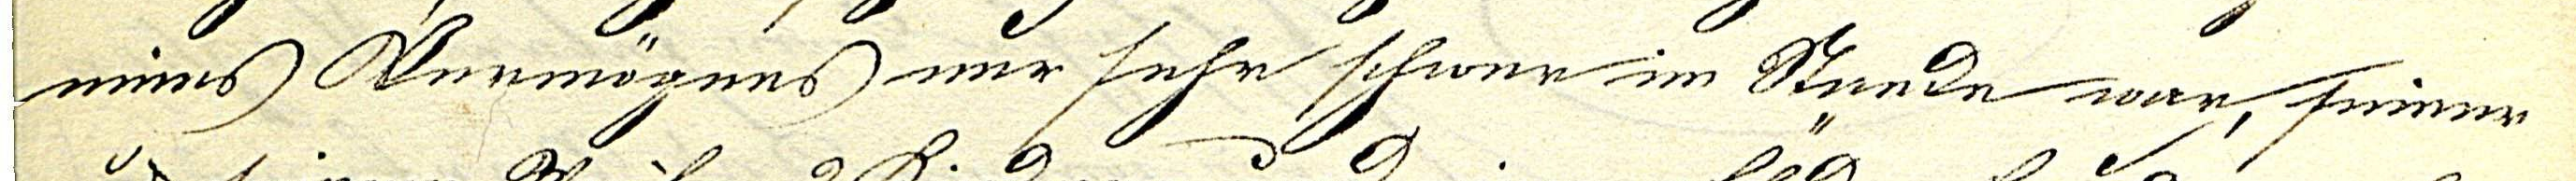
eines Vermögens nur sehr schwer im Stande war, seiner
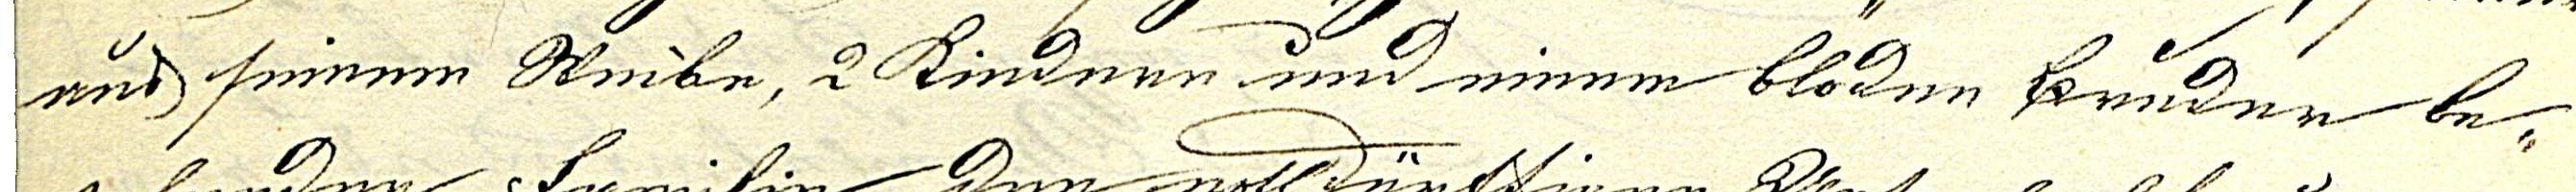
aus seinem Weibe, 2 Kindern und einem blöden Bruder be¬
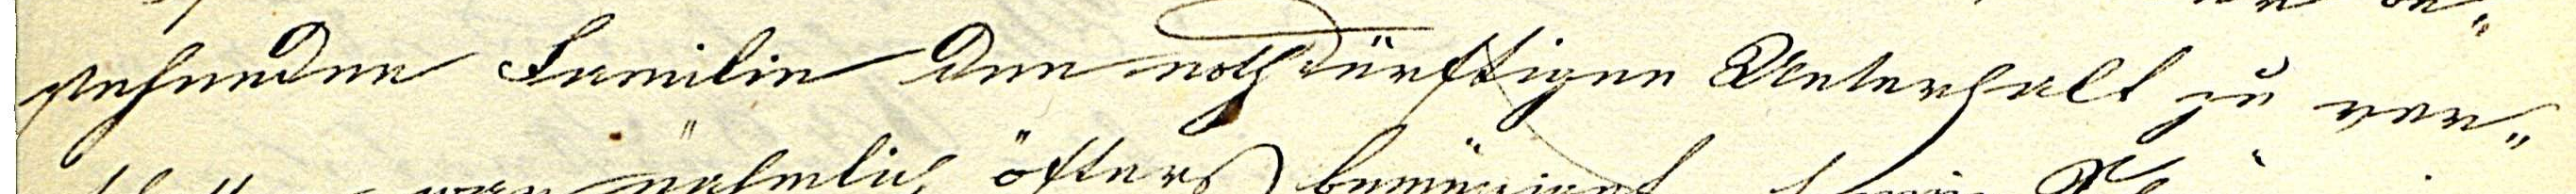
stehenden Familie den nothdürftigen Unterhalt zu ver¬
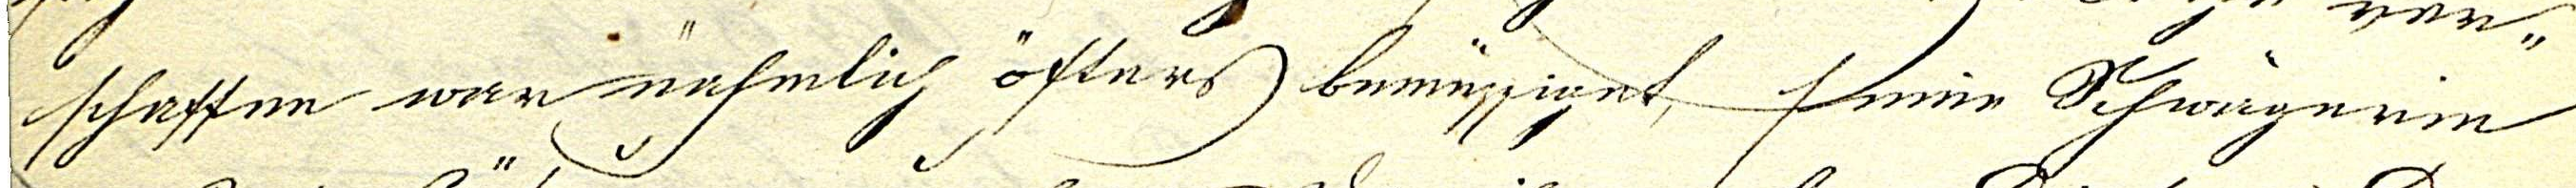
schaffen war nämlich öfters bemüssiget, seine Schwägerin
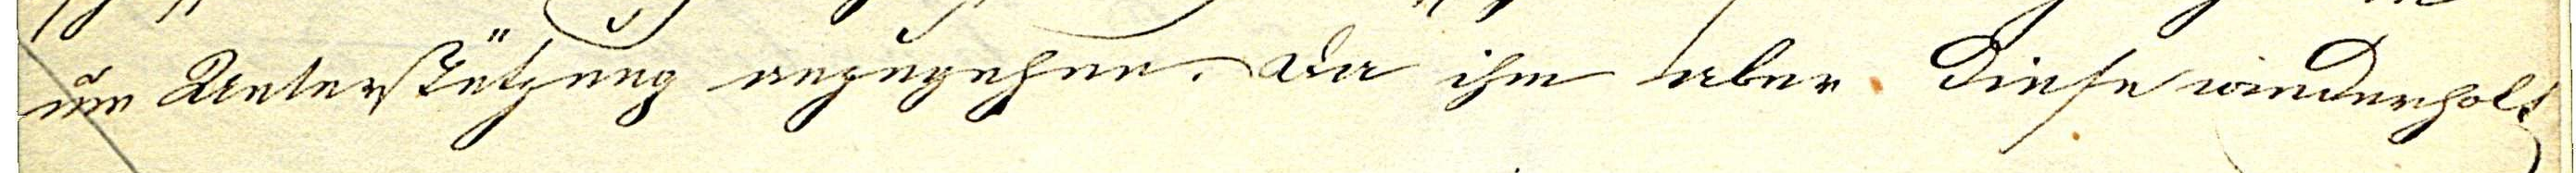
um Unterstützung anzugehen. Da ihm aber diese wiederholt
